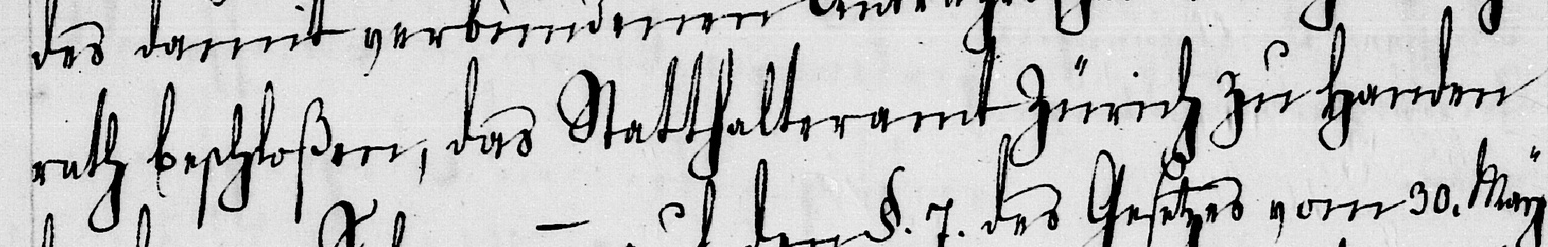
rath beschloßen, das Statthalteramt Zürich zu Handen
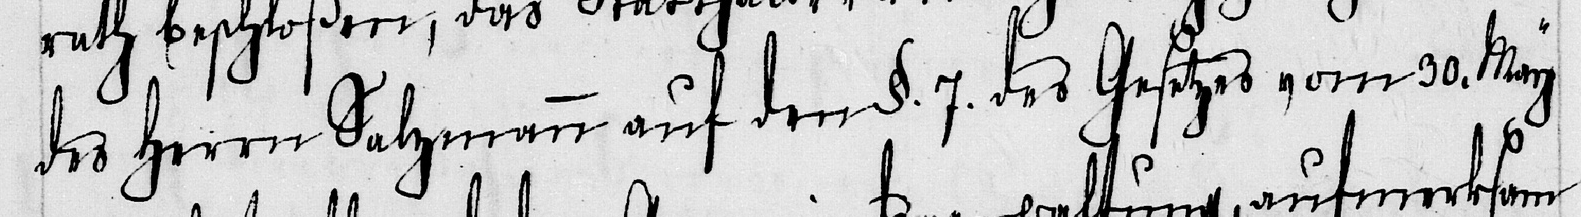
des Herrn Salzmann auf den §. 7 des Gesetzes vom 30. März
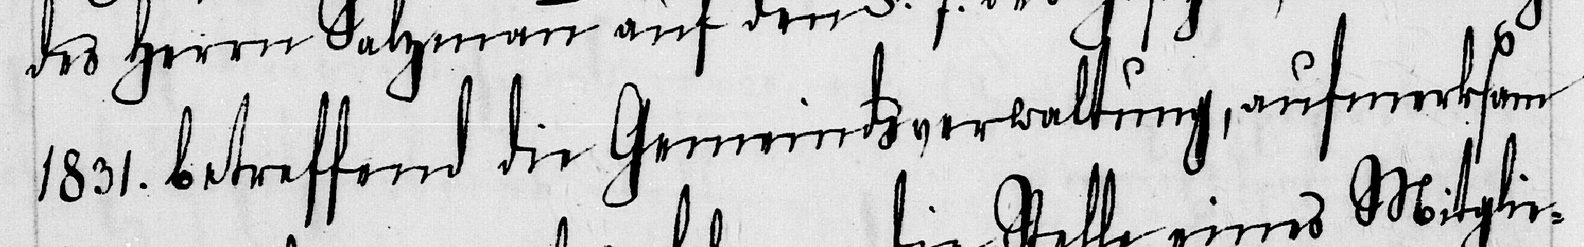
1831. betreffend die Gemeindsverwaltung, aufmerksam
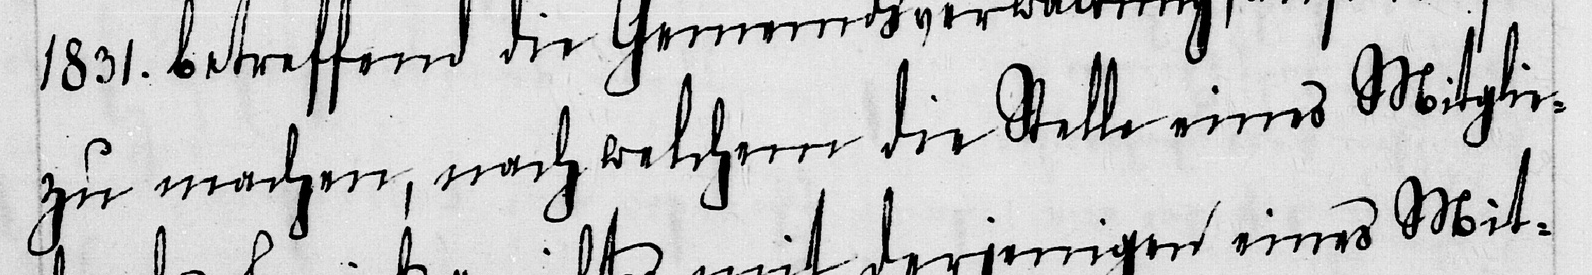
zu machen, nach welchem die Stelle eines Mitglie¬
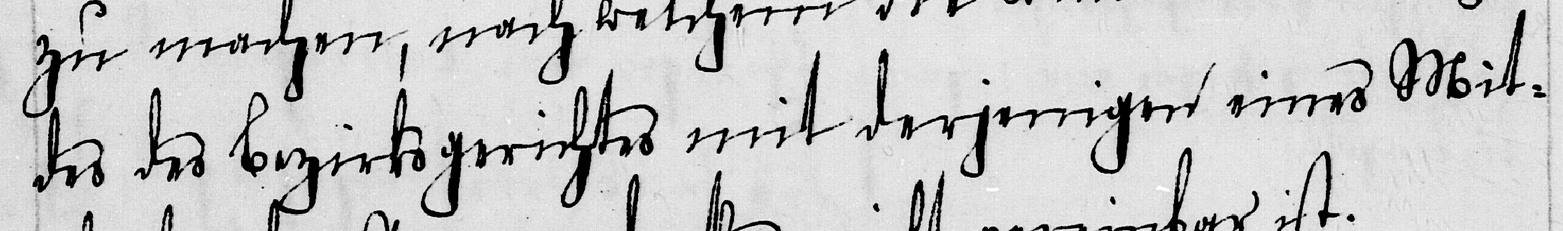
des des Bezirksgerichtes mit derjenigen eines Mit¬
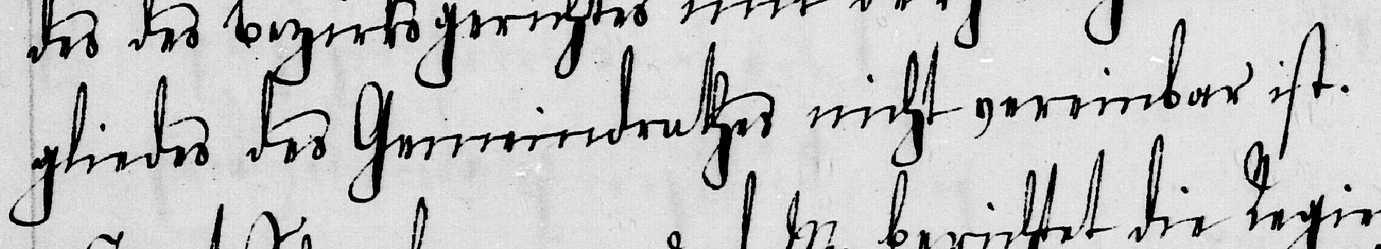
gliedes des Gemeindrathes nicht vereinbar ist.
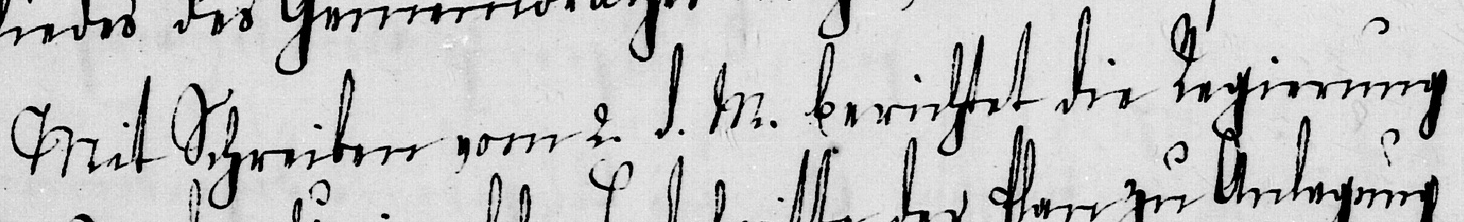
Mit Schreiben vom 2. d. M. berichtet die Regierung
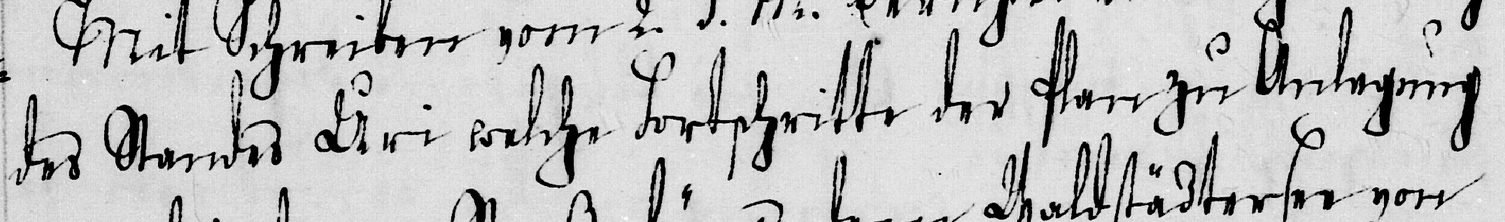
des Standes Uri welche Fortschritte der Plan zu Anlegung
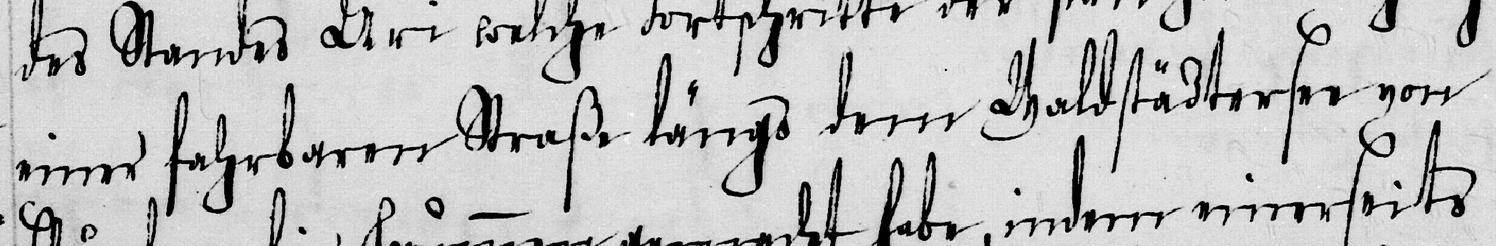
einer fahrbaren Straße längs dem Waldstädtersee von
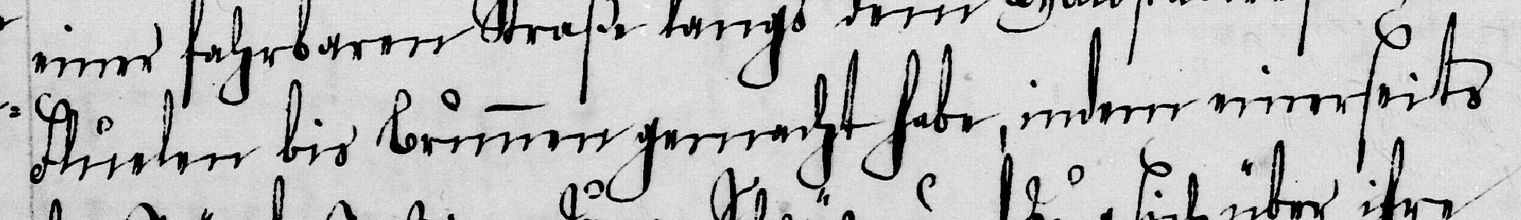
Fluelen bis Brunnen gemacht habe, indem einerseits
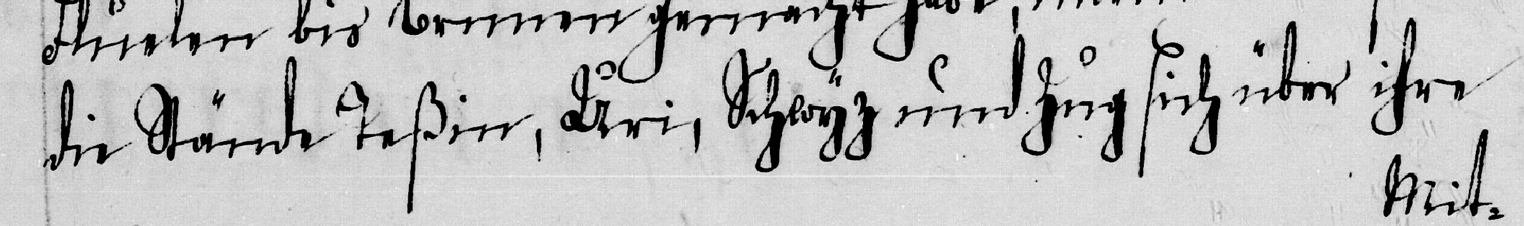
die Stände Teßin, Uri, Schwyz und Zug sich über ihre
